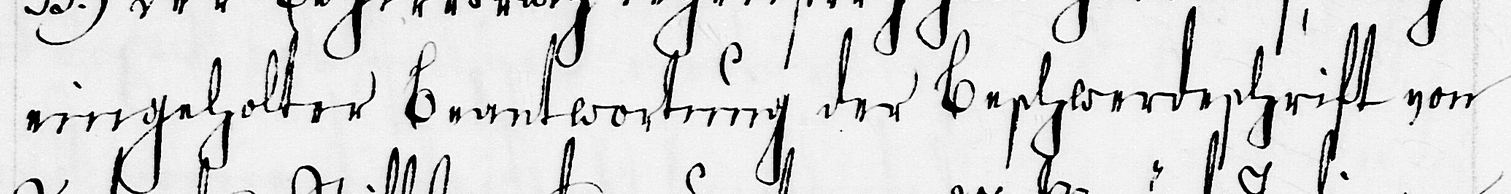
eingeholter Beantwortung der Beschwerdeschrift von
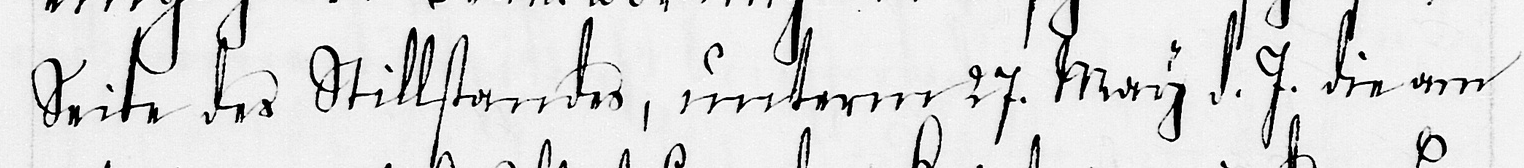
Seite des Stillstandes, unterm 27. May d. J. die am
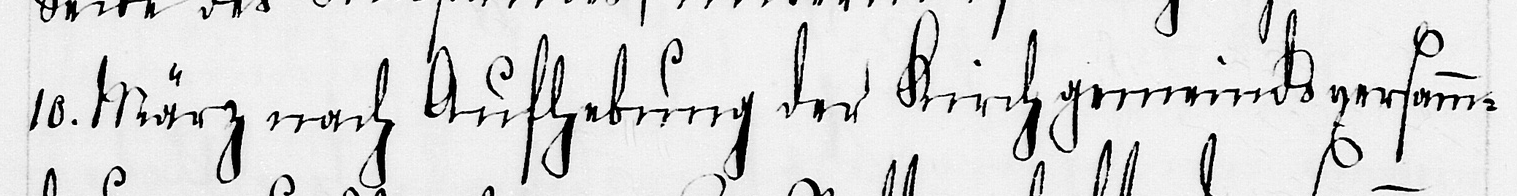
10. März nach Aufhebung der Kirchgemeindsversamm¬
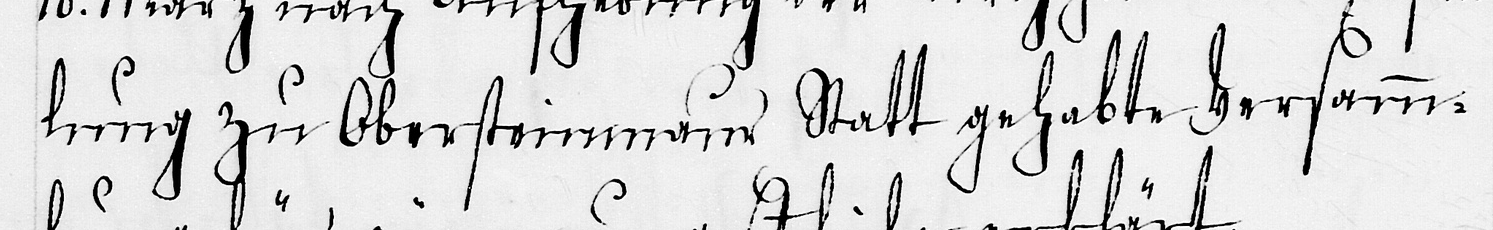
lung zu Obersteinmaur Statt gehabte Versamm¬
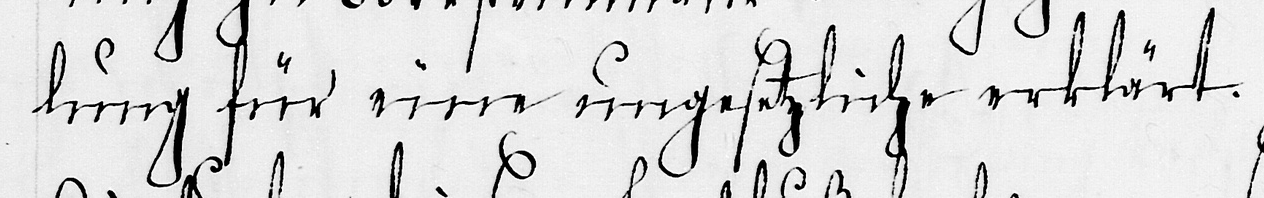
lung für eine ungesetzliche erklärt.
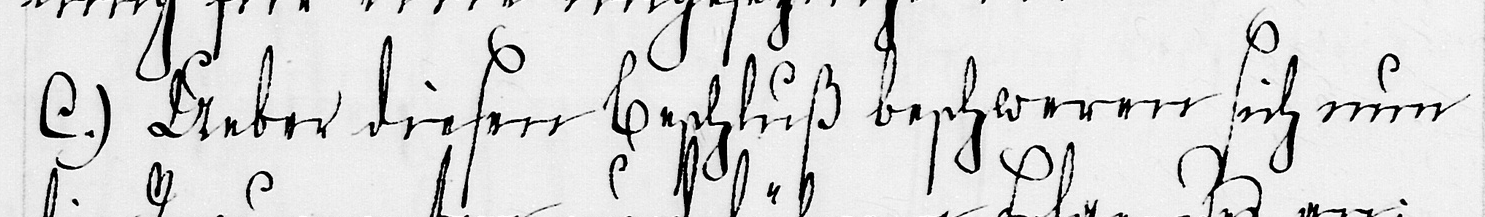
C.) Ueber diesen Beschluß beschweren sich nun
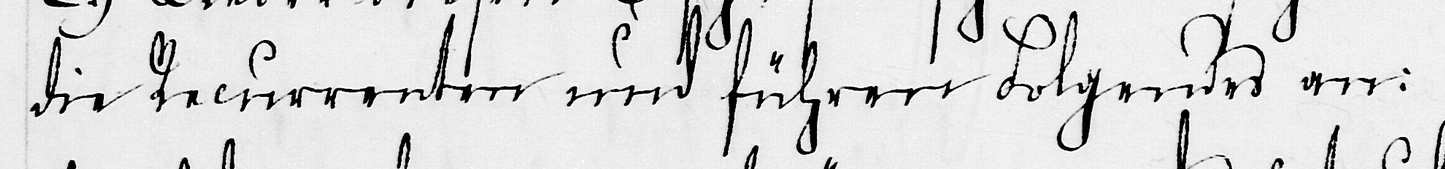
die Recurrenten und führen Folgendes an:
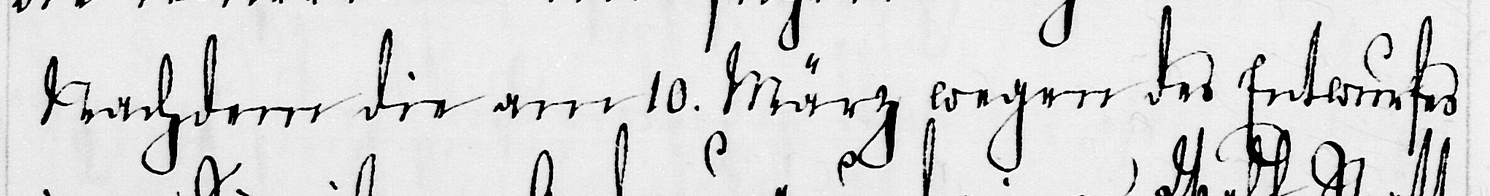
Nachdem die am 10. März wegen des Entwurfes
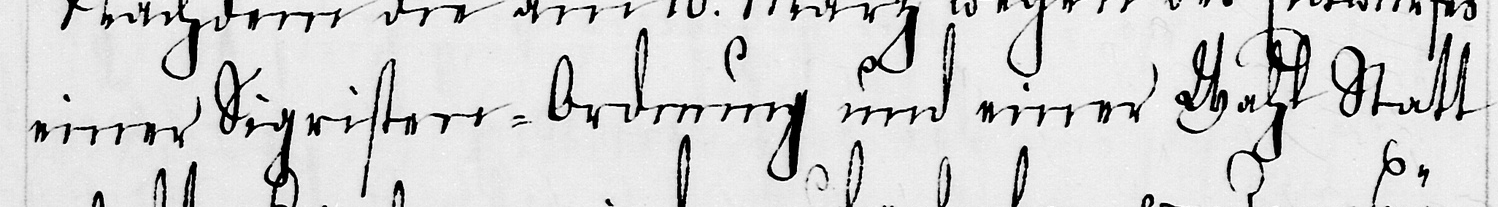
einer Sigristen-Ordnung und einer Wahl Statt
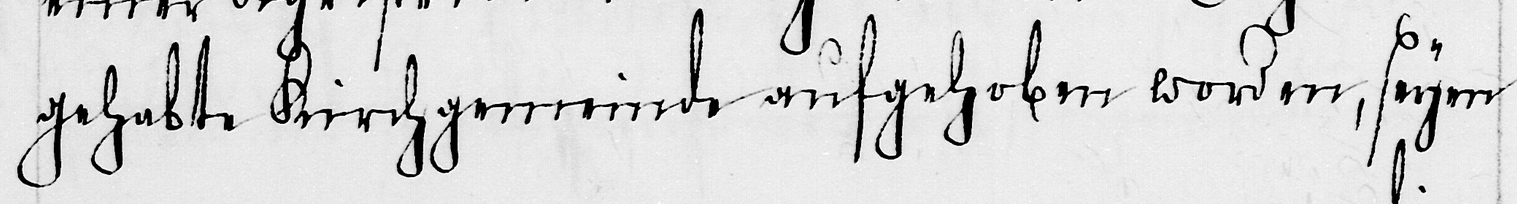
gehabte Kirchgemeinde aufgehoben worden, seyen
